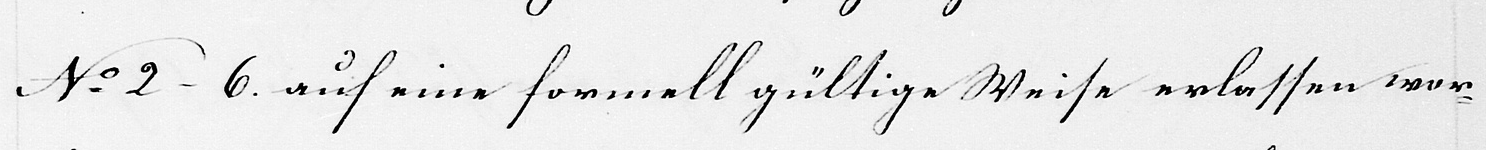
No 2−6. auf eine formell gültige Weise erlassen wor¬
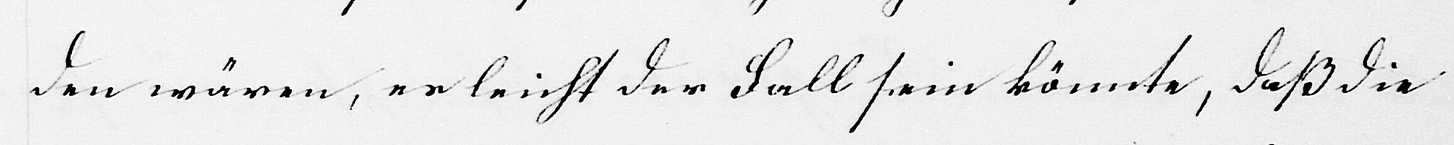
den wären, es leicht der Fall sein könnte, daß die
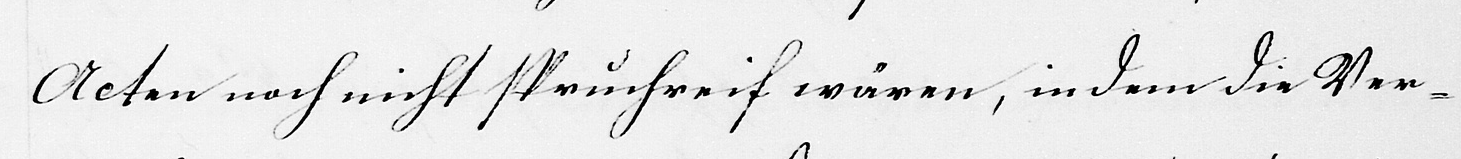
Acten noch nicht spruchreif wären, in dem die Ver¬
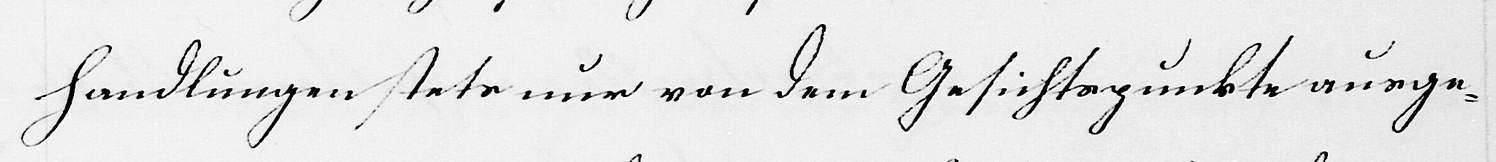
handlungen stets nur von dem Gesichtspunkte ausge¬
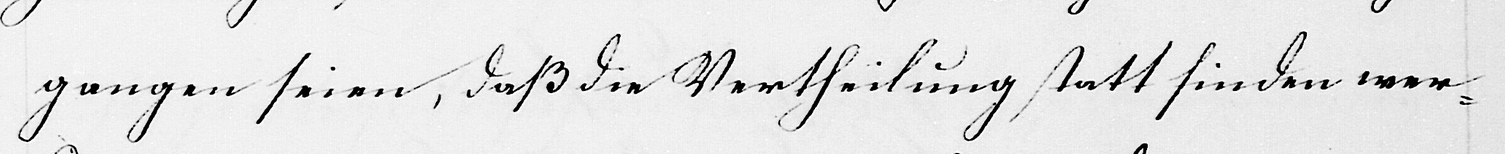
gangen seien, daß die Vertheilung statt finden wer¬
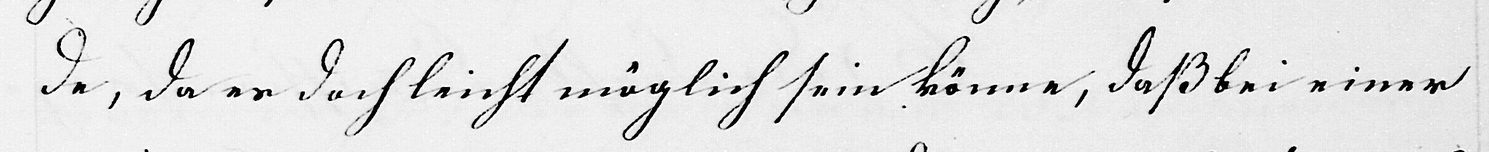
de, da es doch leicht möglich sein könne, daß bei einer
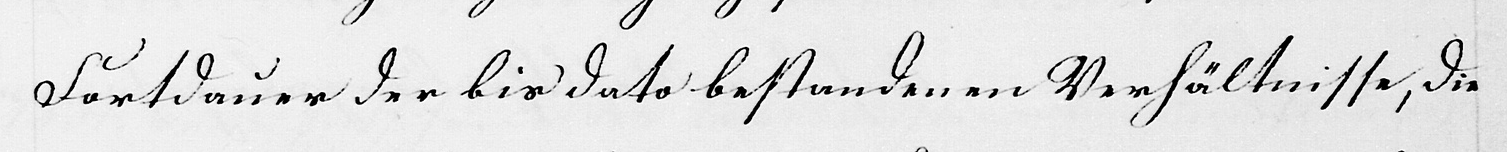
Fortdauer der bis dato bestandenen Verhältnisse, die
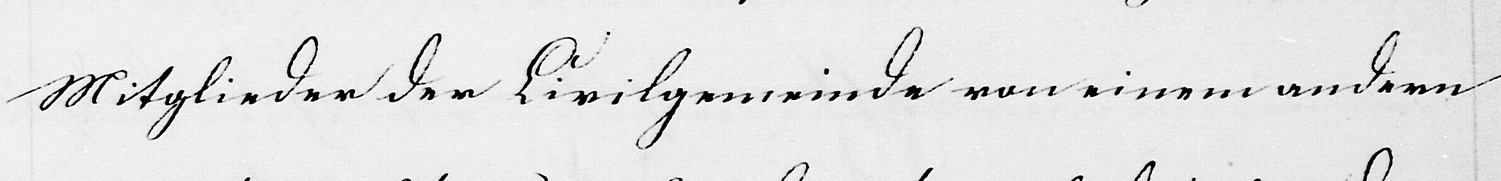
Mitglieder der Civilgemeinde von einem andern
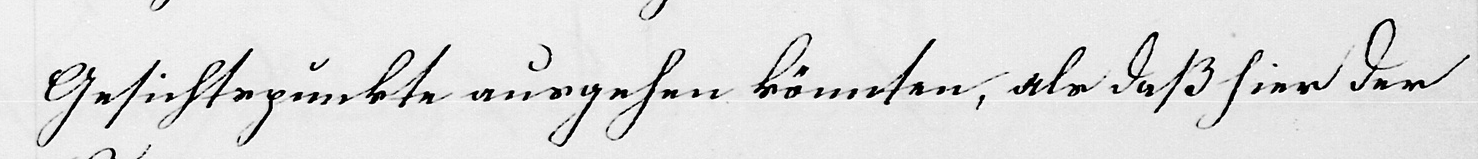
Gesichtspunkte ausgehen könnten, als daß hier der
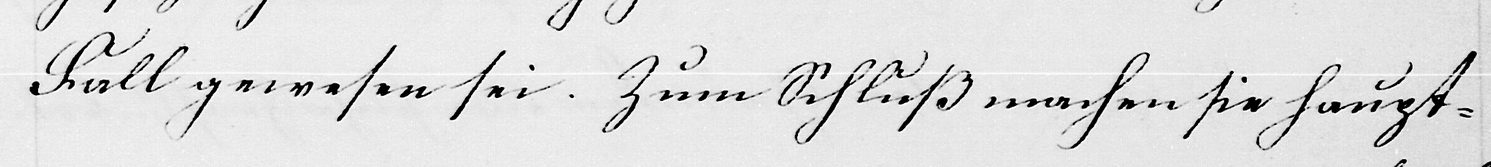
Fall gewesen sei. Zum Schluß machen sie haupt-
